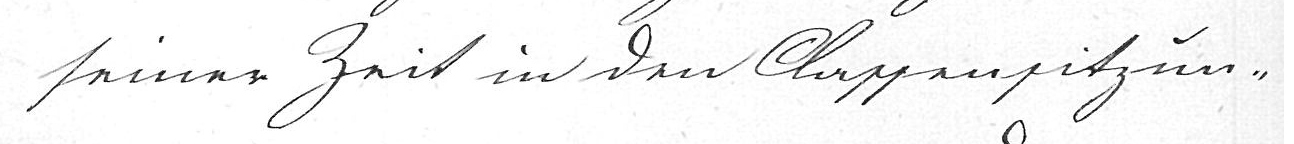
seiner Zeit in den Classensitzun-
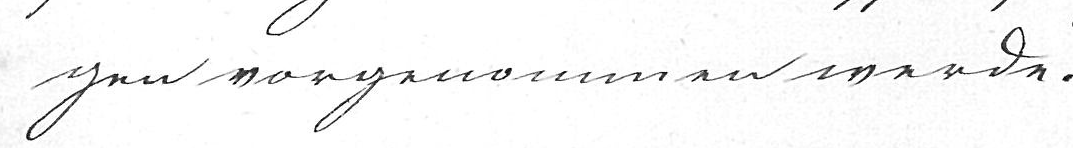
den vorgenommen werde.
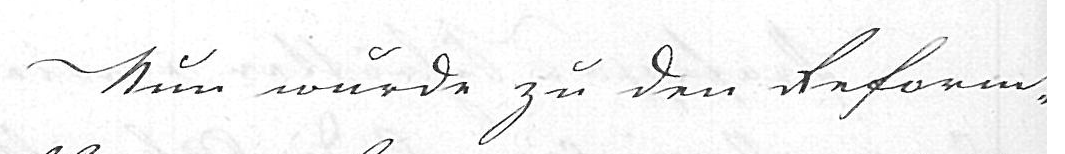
Nun wurde zu den Reform-
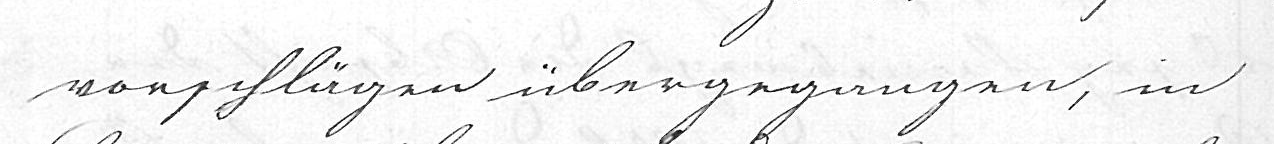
vorschlägen übergeangen, in
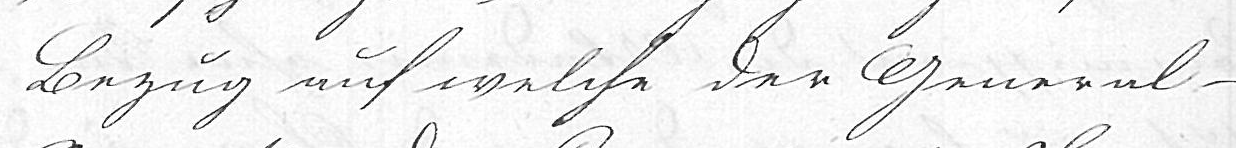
Bezug auf welche der General-
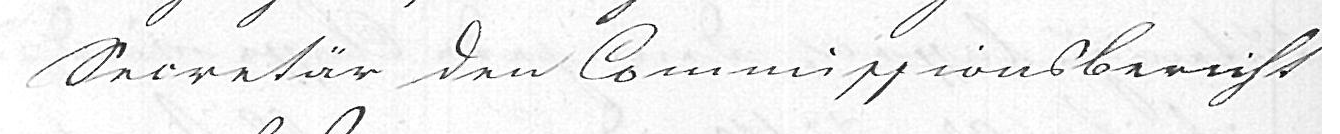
Secretär den Commissionsbericht
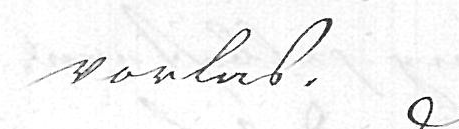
vorlas.
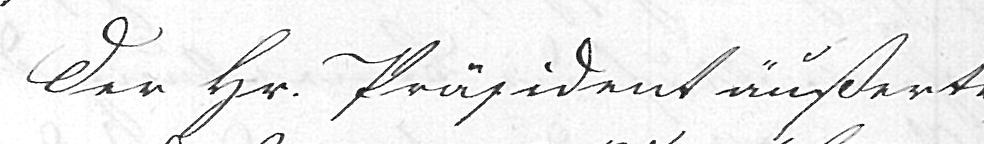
Die Hr. Präsident äußerte
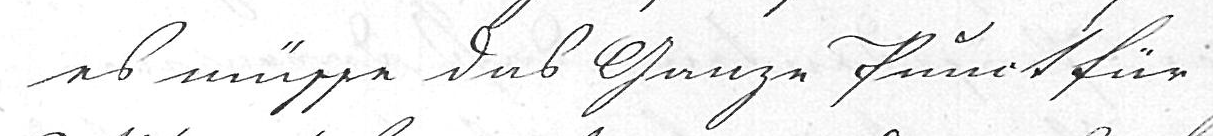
es müsse das Ganzen Punct für
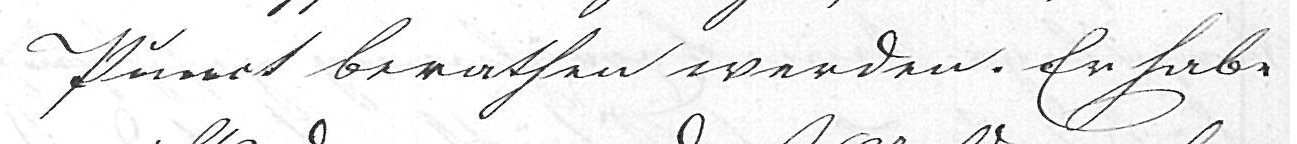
Punct berathen werden. Er habe
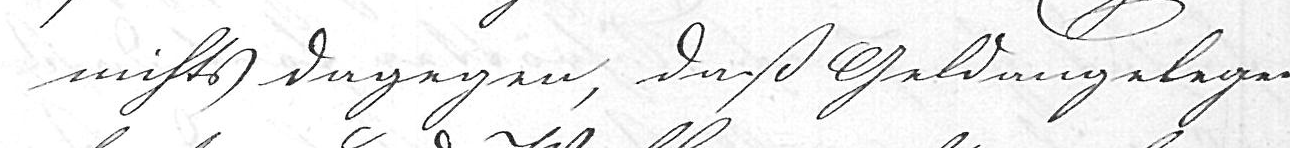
nichts dagegen daß Geldangelegen-
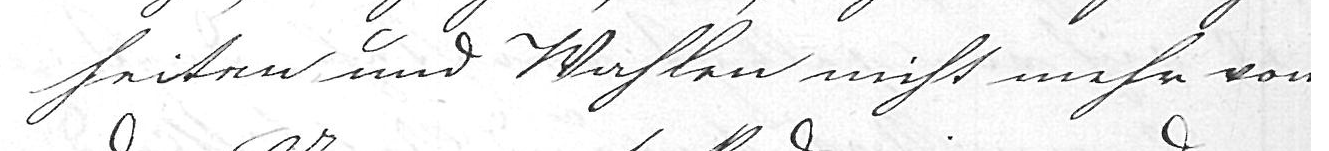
heiten und Wahlen nicht mehr von
